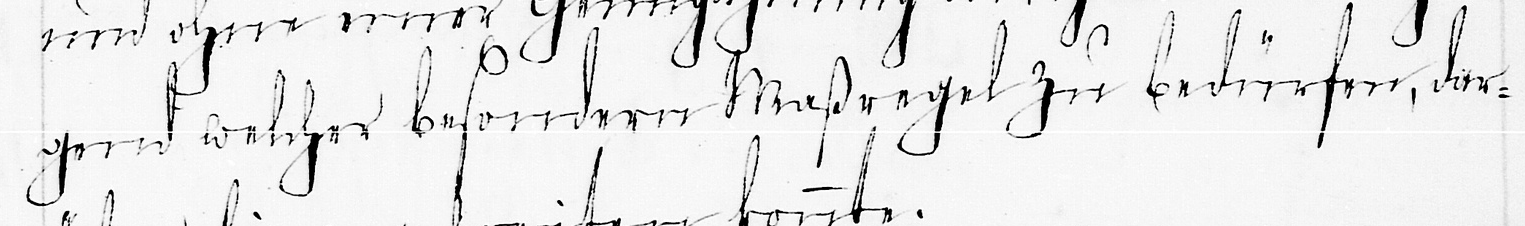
gend welcher besondern Maßregel zu bedürfen, dar¬
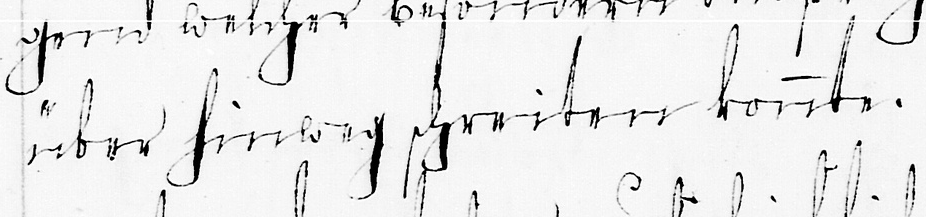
über hinweg schreiten konnte.
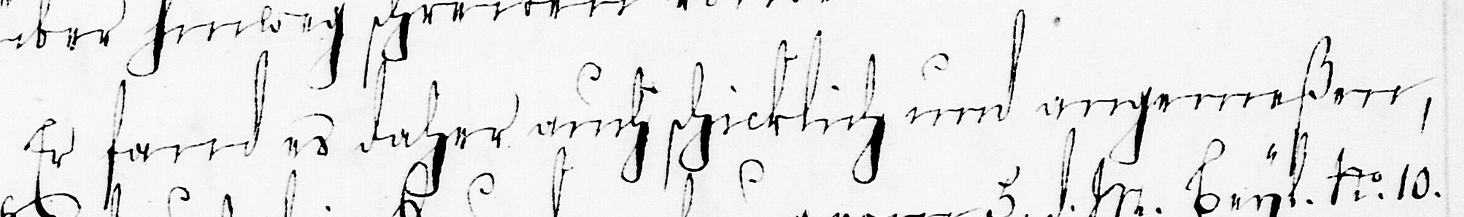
Er fand es daher auch schicklich und angemeßen,
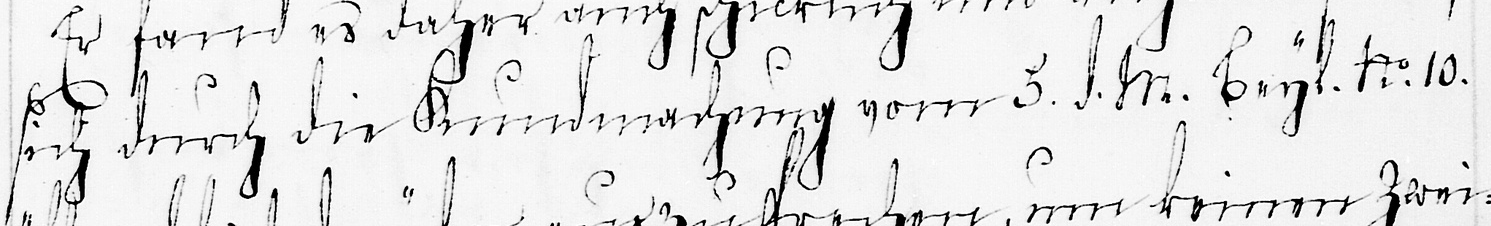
sich durch die Kundmachung vom 5. d. M. Beyl. No. 10.
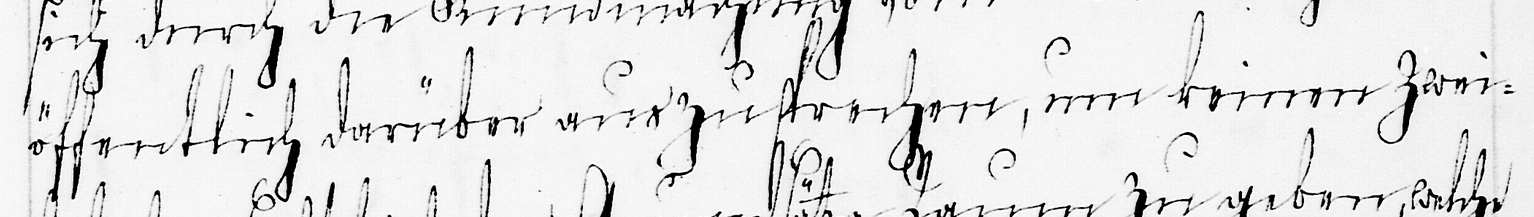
öffentlich darüber auszusprechen, um keinen Zwei¬
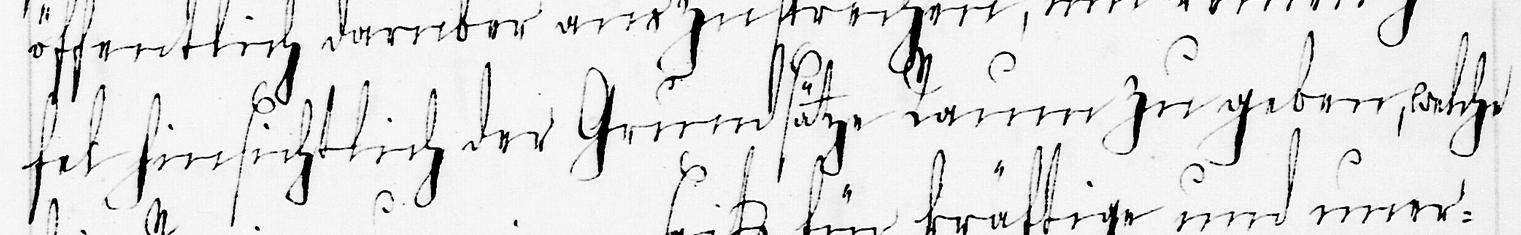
fel hinsichtlich der Grundsätze Raum zu geben, welche
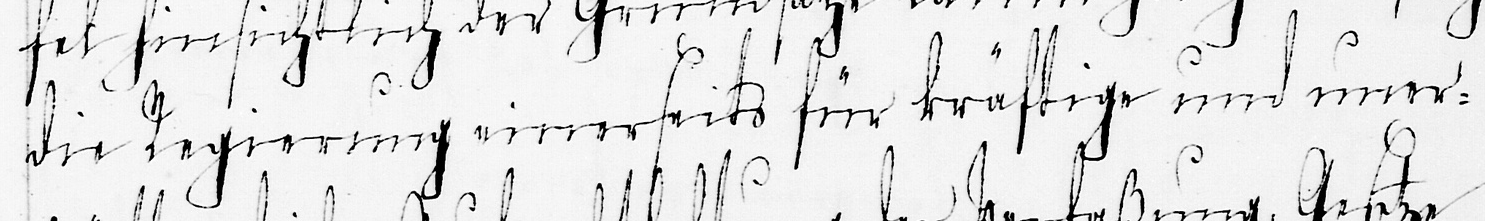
die Regierung einerseits für kräftige und uner¬
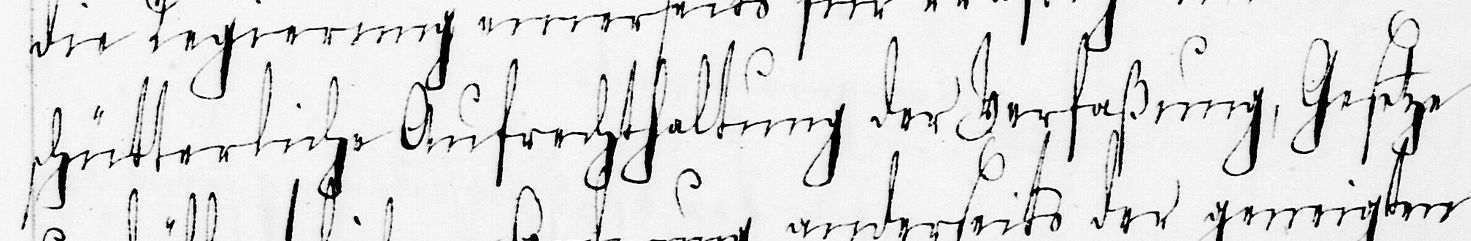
schütterliche Aufrechterhaltung der Verfaßung, Gesetze
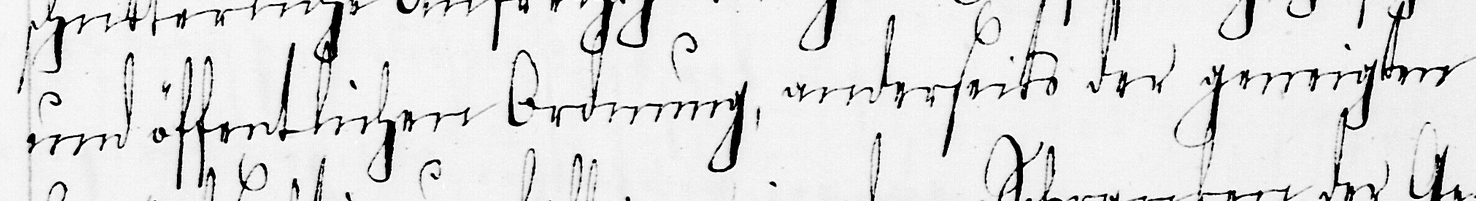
und öffentlichen Ordnung, anderseits der geneigten
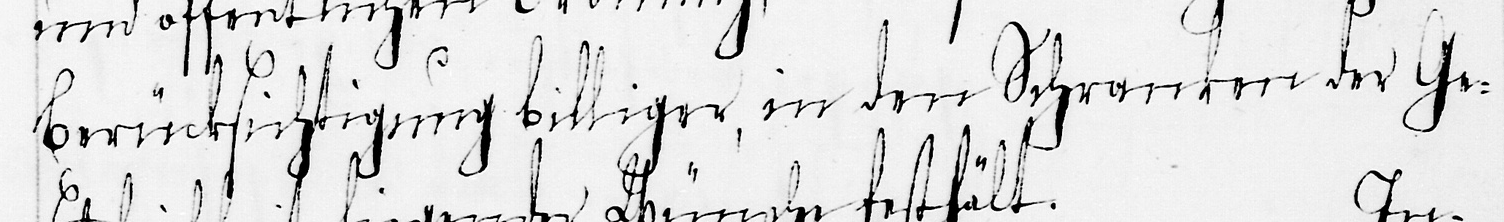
Berücksichtigung billiger, in den Schranken der Ge¬
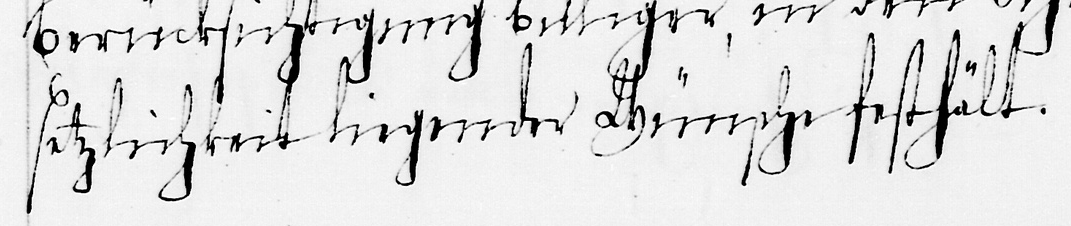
setzlichkeit liegender Wünsche festhält.
